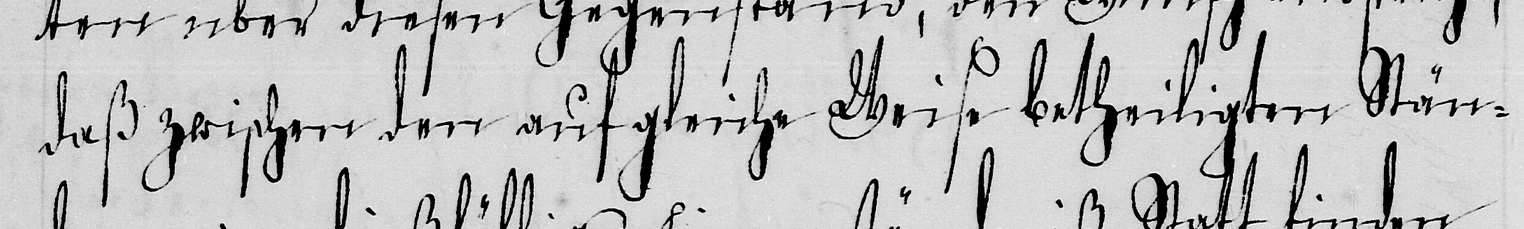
daß zwischen den auf gleiche Weise betheiligten Stän¬
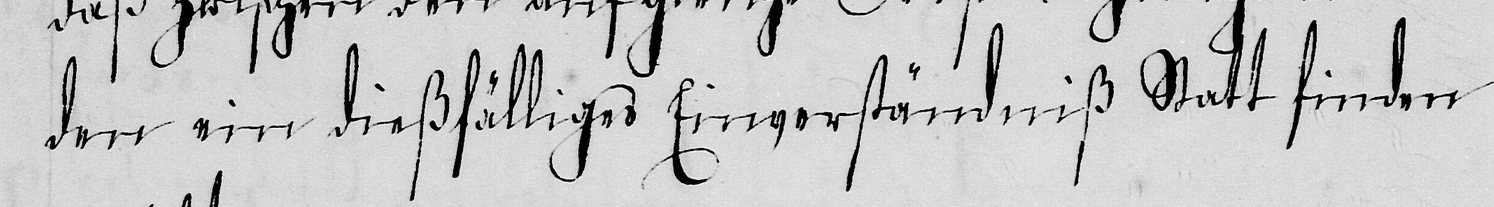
den ein dießfälliges Einverständniß Statt finden
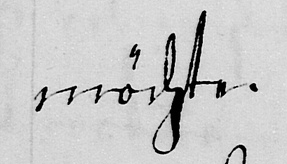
möchte.
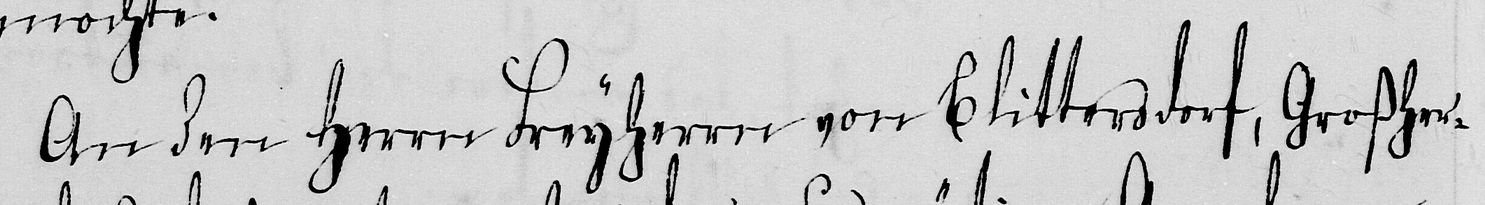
An den Herrn Freyherrn von Blittersdorf, Großhe¬
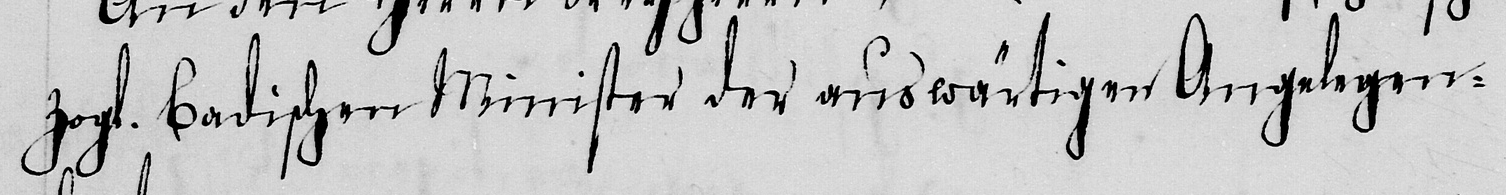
rzogl. Badischen Minister der auswärtigen Angelegen¬
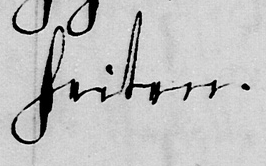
heiten.
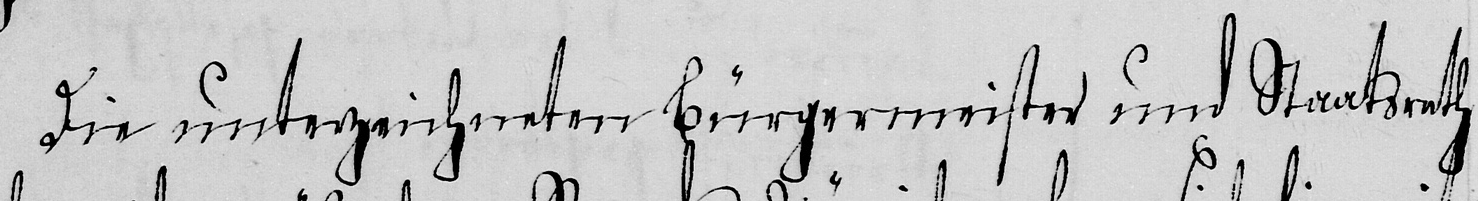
Die unterzeichneten Bürgermeister und Staatsrath
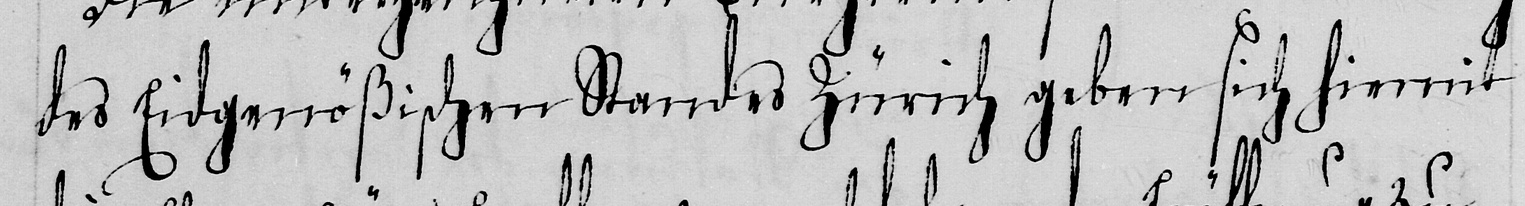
des Eidgenößischen Standes Zürich geben sich hiemit
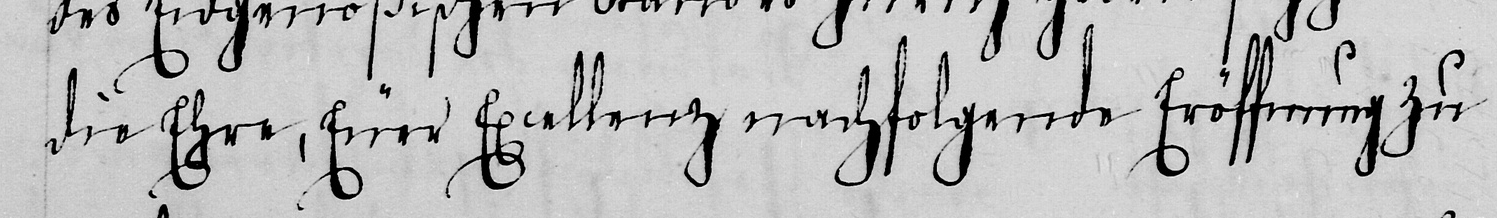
die Ehre, Euer Excellenz nachfolgende Eröffnung zu
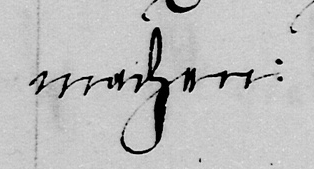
machen:
